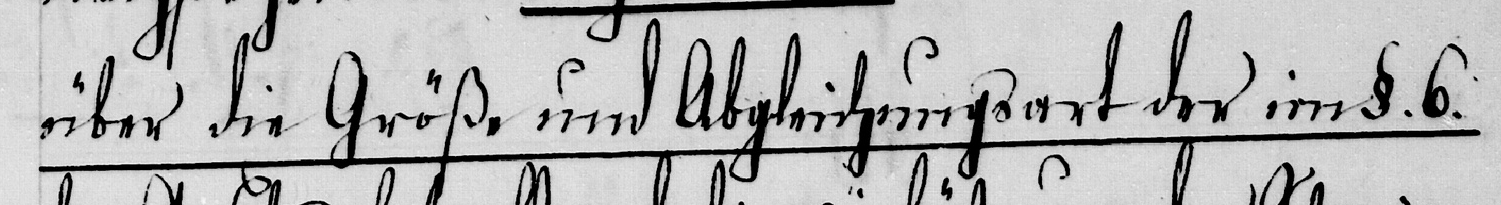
über die Größe und Abgleichungsart der im §. 6.
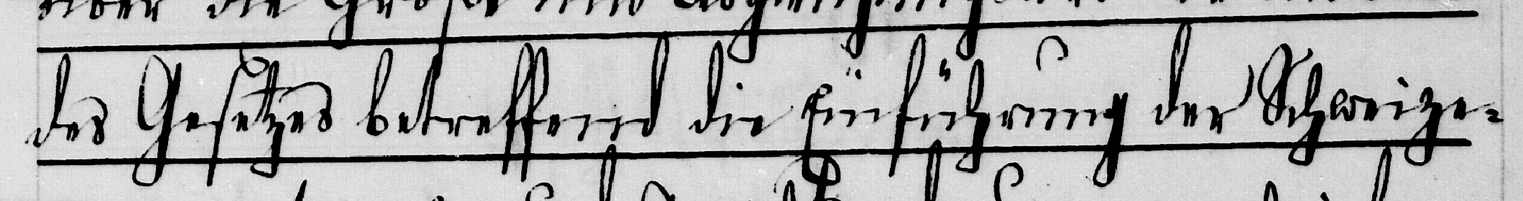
des Gesetzes betreffend die Einführung der Schweize¬
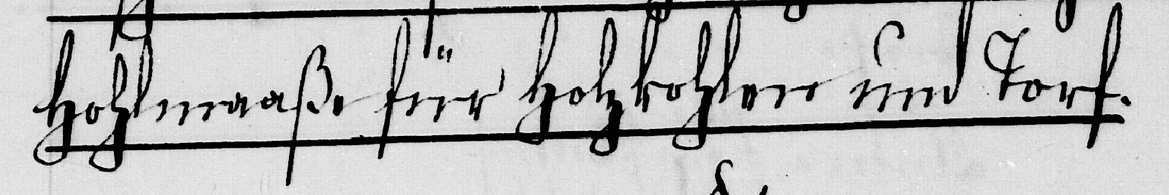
Hohlmaaße für Holzkohlen und Torf.
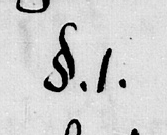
§. 1.
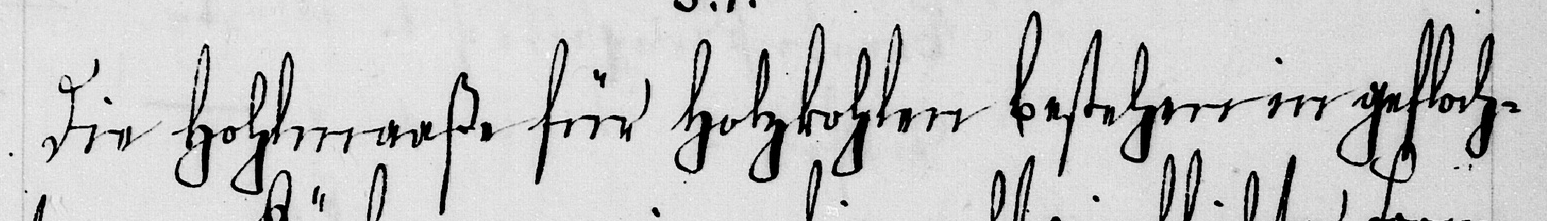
Die Hohlmaaße für Holzkohlen bestehen in gefloc¬
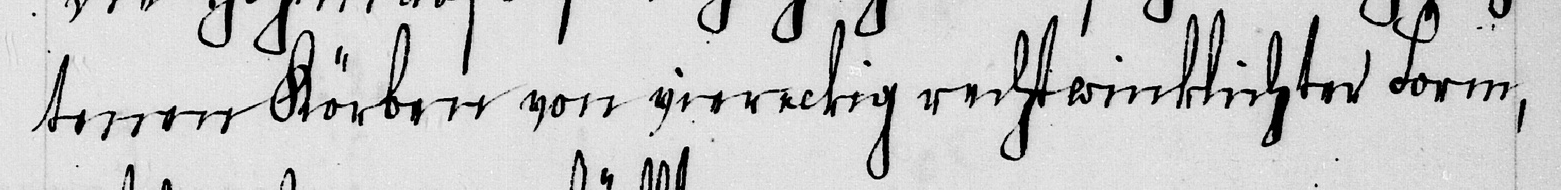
htenen Körben von viereckig rechtwinklichter Form,
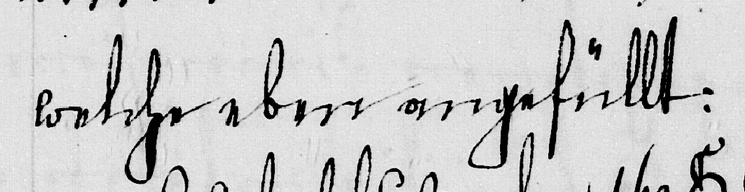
welche eben angefüllt:
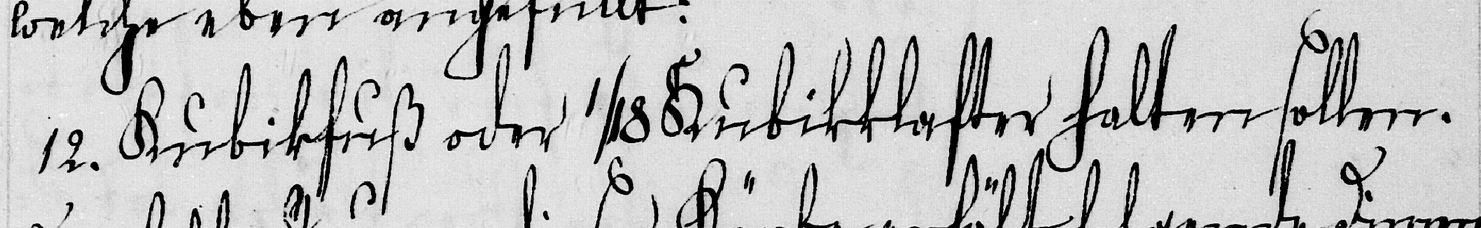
12. Kubikfuß oder 1/18 Kubikklafter halten sollen.
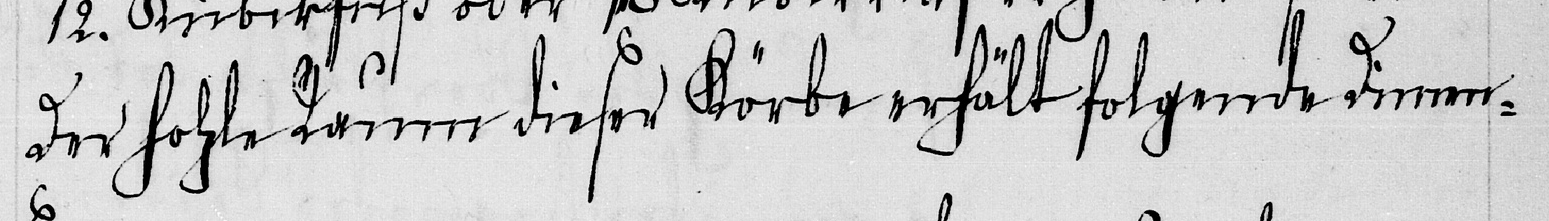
Der Hohle Raum dieser Körbe erhält folgende Dimen¬
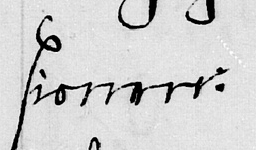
sionen:
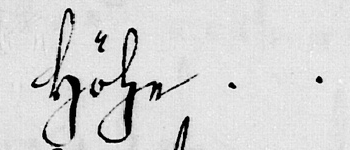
Höhe
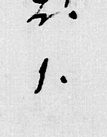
1.
